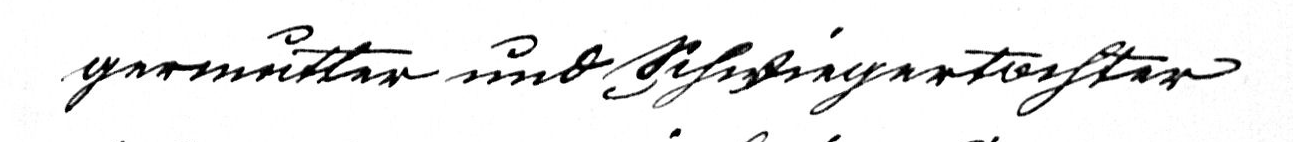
germutter und Schwiegertochter
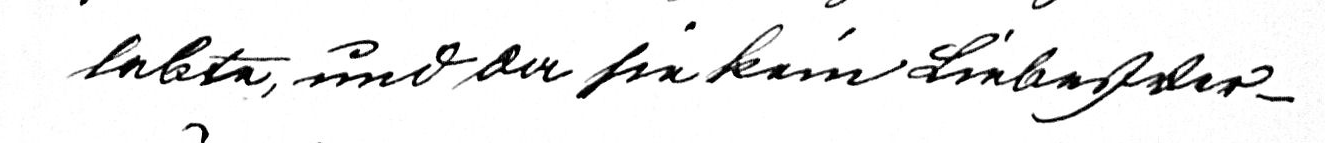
lebte, und da sie kein Liebesver¬
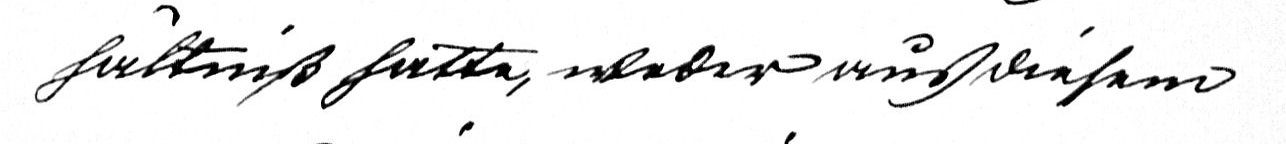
hältniß hatte, weder aus diesem
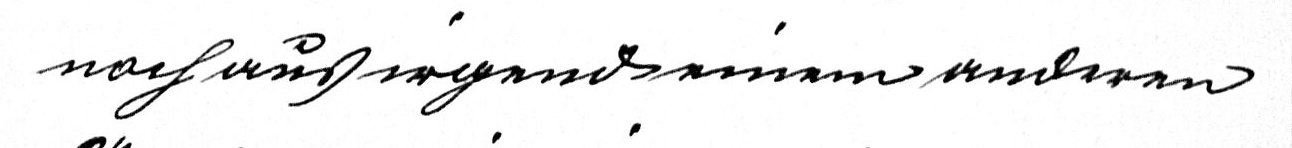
nach aus irgendeinem anderen
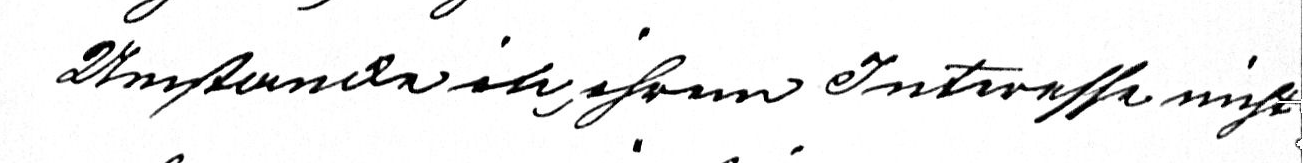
Umstande in ihrem Interesse nicht
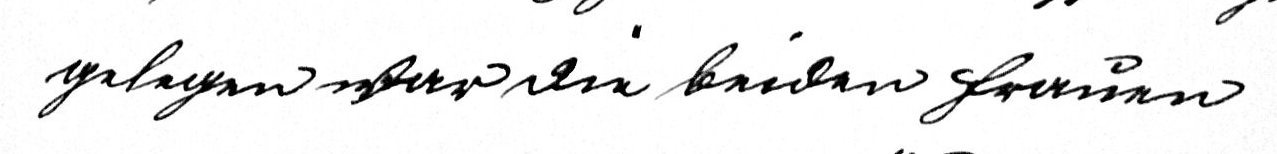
gelegen war die beiden Frauen
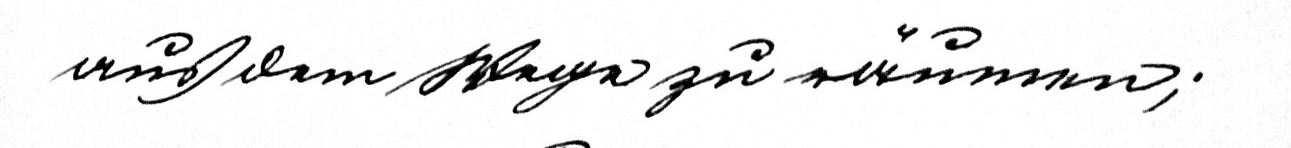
aus dem Wege zu räumen;
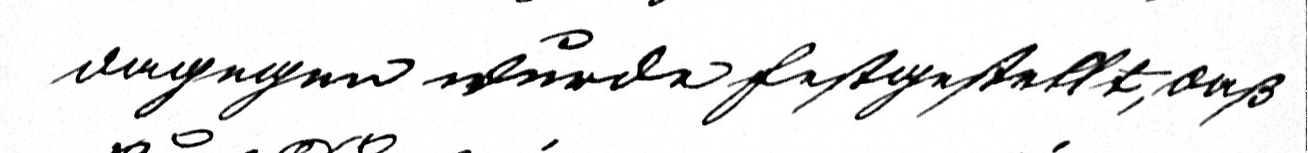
dagegen wurde festgestellt, daß
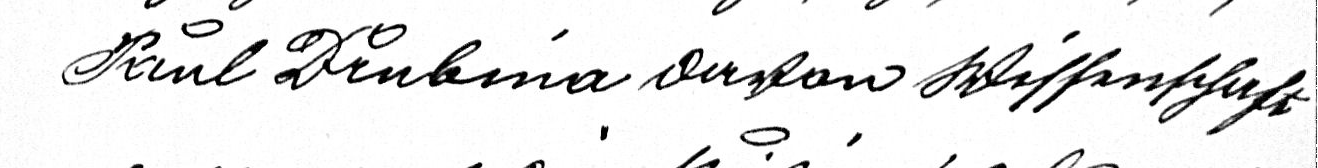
Paul Drubina davon Wissenschaft
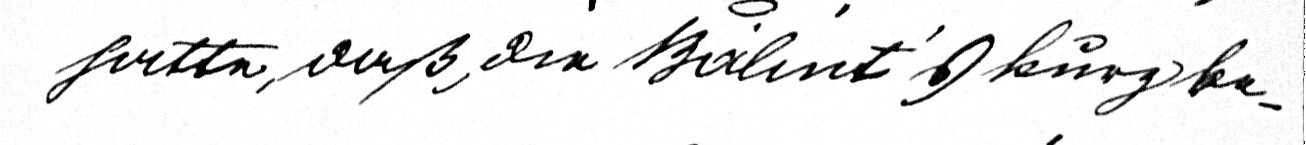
hatte,daß, die Bálint'skurz be¬
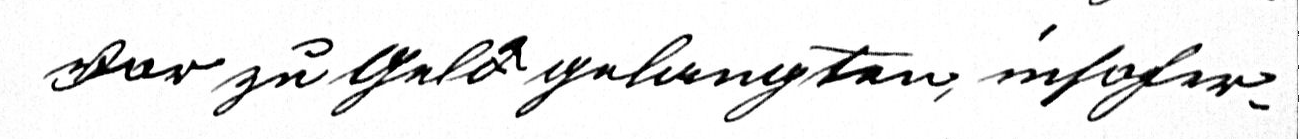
vor zu Geld gelangten, insofer¬
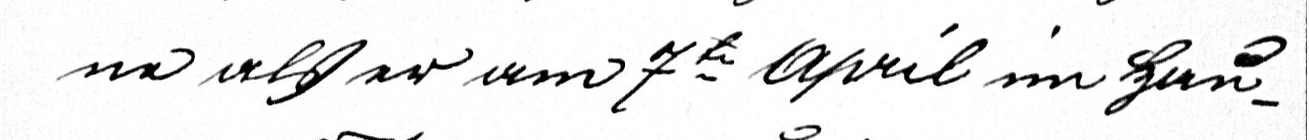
ne als er am 7th April im Hau¬
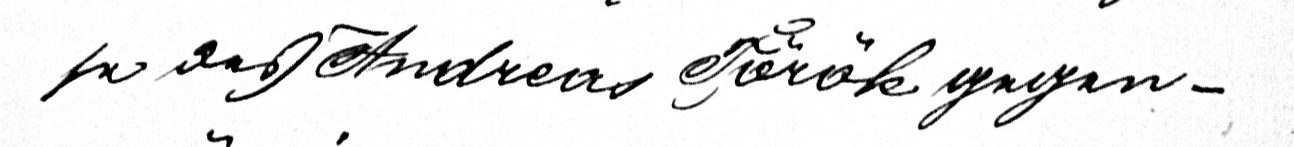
se des Andreas Török gegen¬
